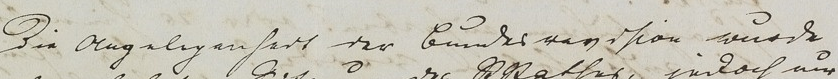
Die Angelegenheit der Bundesrevision wurde
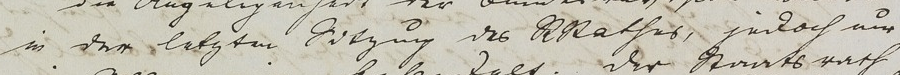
in der letzten Sitzung des RRathes, jedoch nur
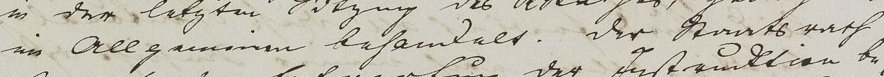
im Allgemeinen behandelt. Der Staatsrath
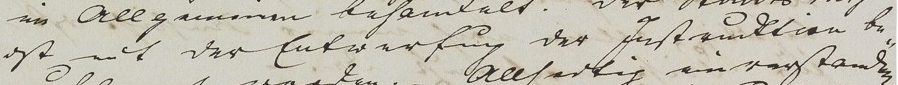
ist mit der Entwerfung der Instruktion be-
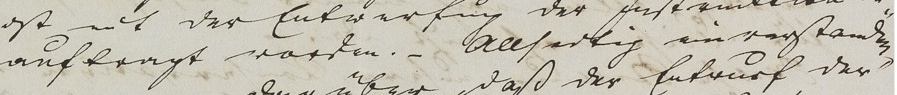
auftragt worden. – Allseitig einverstanden
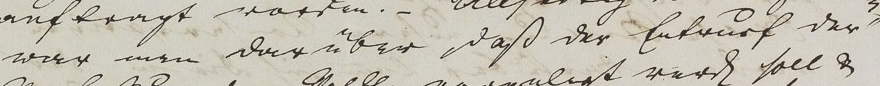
war man darüber, daß der Entwurf der
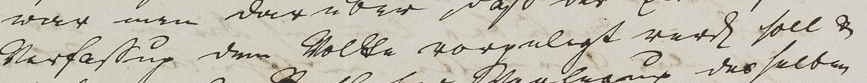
Verfassung dem Volke vorgelegt werden soll &
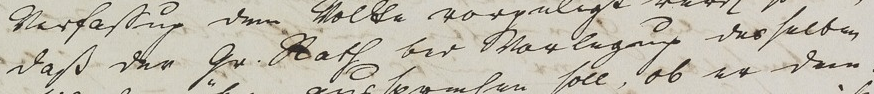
daß der Gr. Rath bei Vorlegung desselben
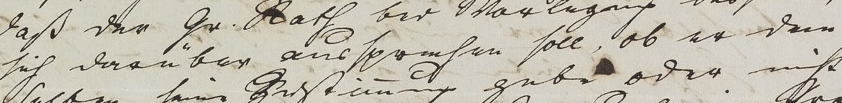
sich darüber aussprechen soll, ob er dem-
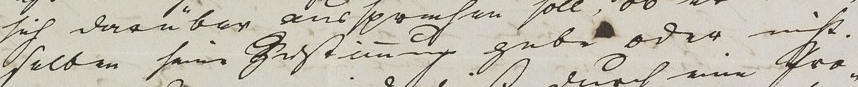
selben seine Zustimmung gebe oder nicht.
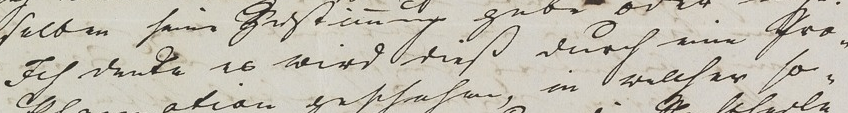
Ich denke es wird dieß durch eine Pro-
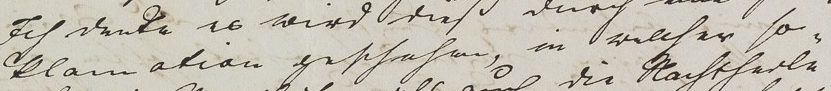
klamation geschehen, in welcher so-
